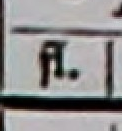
fl.
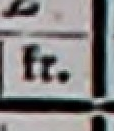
kr.
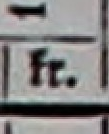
kr.
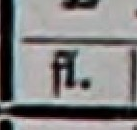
fl.
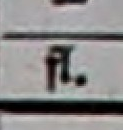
fl.
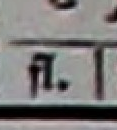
fl.
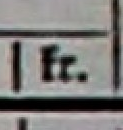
kr.
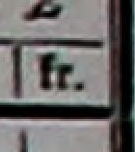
kr.
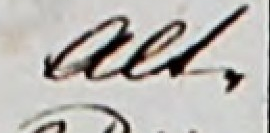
Alt„
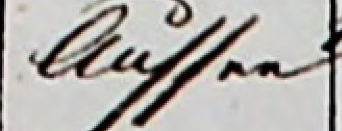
Aussee
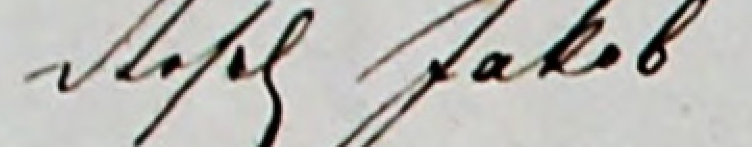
Desch Jakob
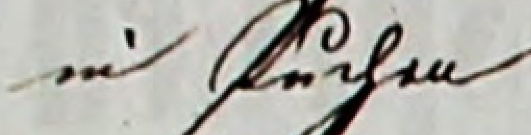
in Puchen
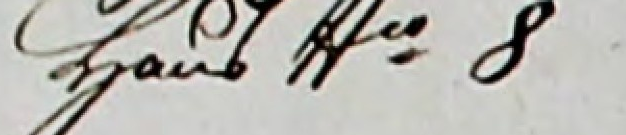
Haus No 8
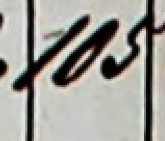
105
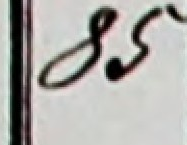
85
